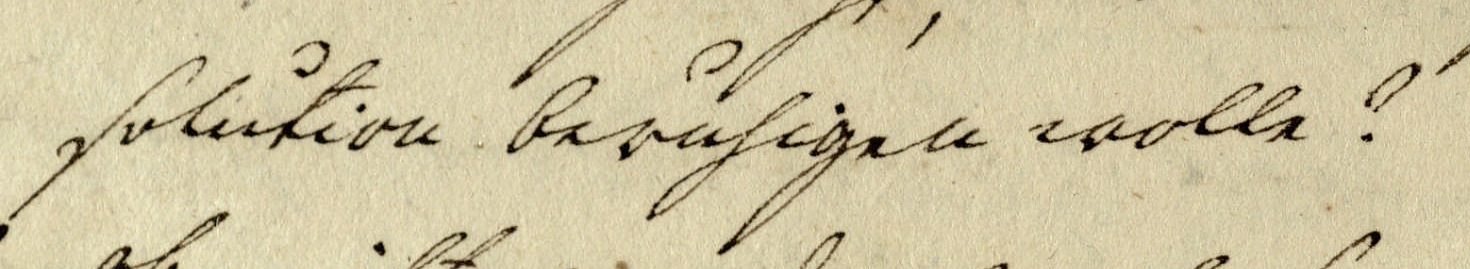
solution beruhigen wolle ?
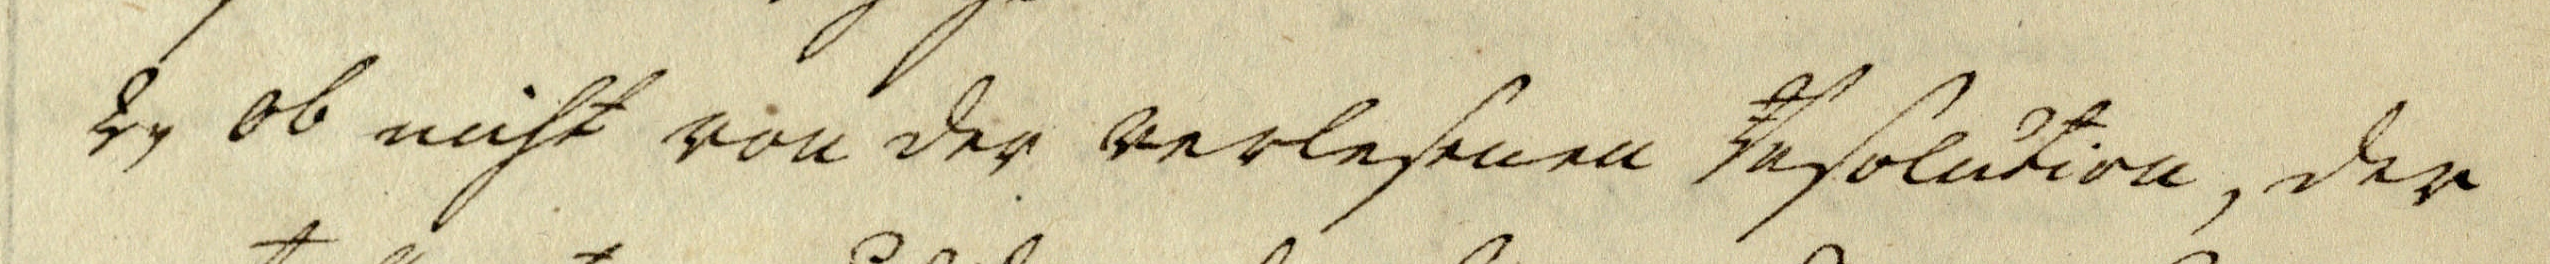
2., ob nicht von der verlesenen Resolution, der
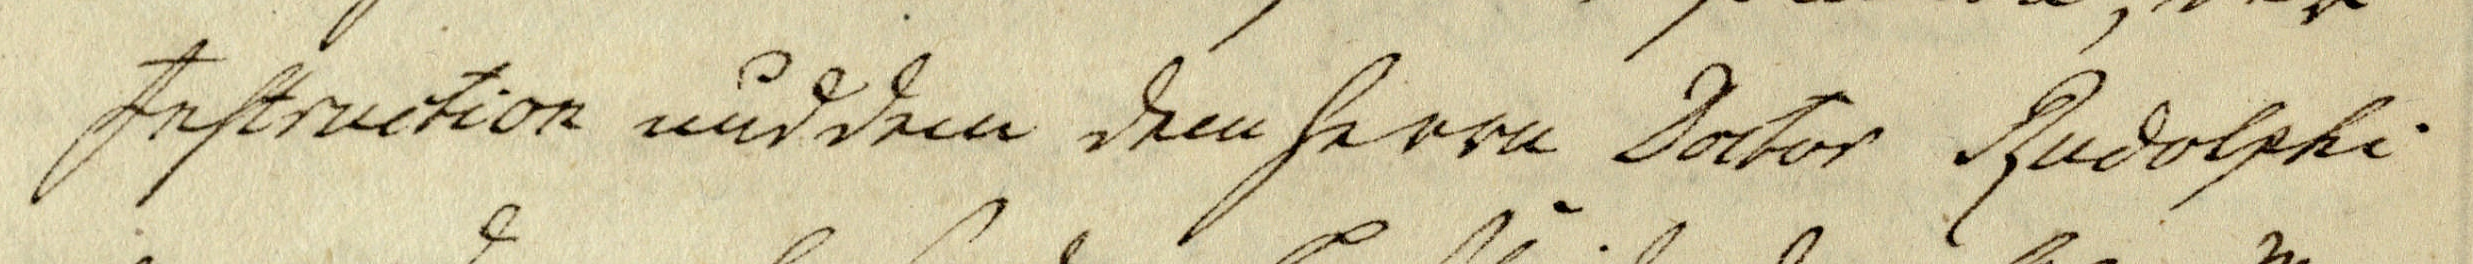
Instruction und dem dem Herrn Doctor Rudolphi
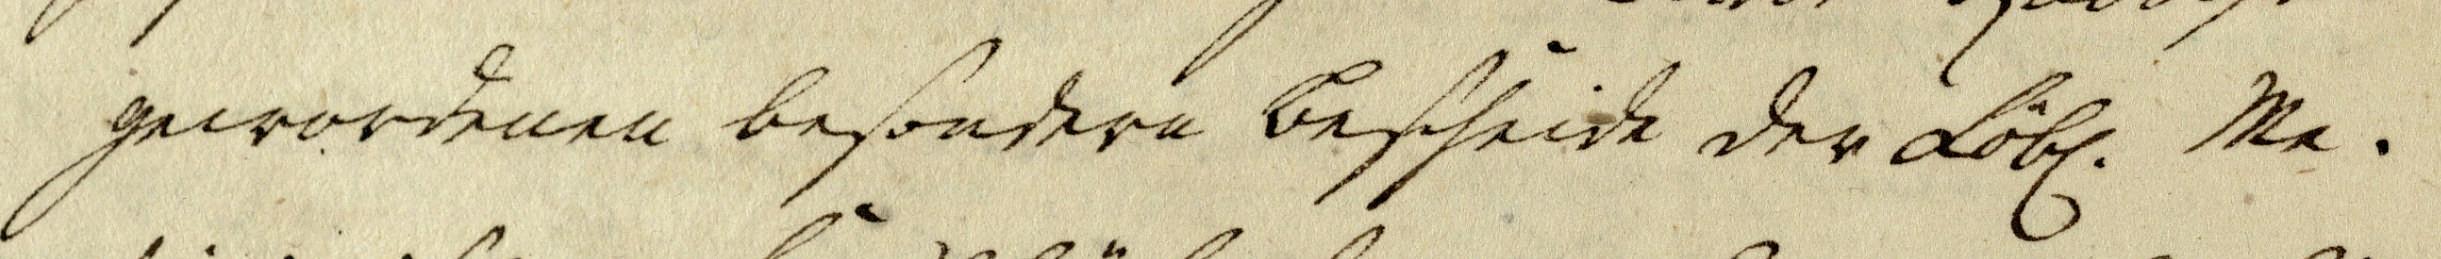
gewordenen besondern Bescheide der Löbl. Me¬
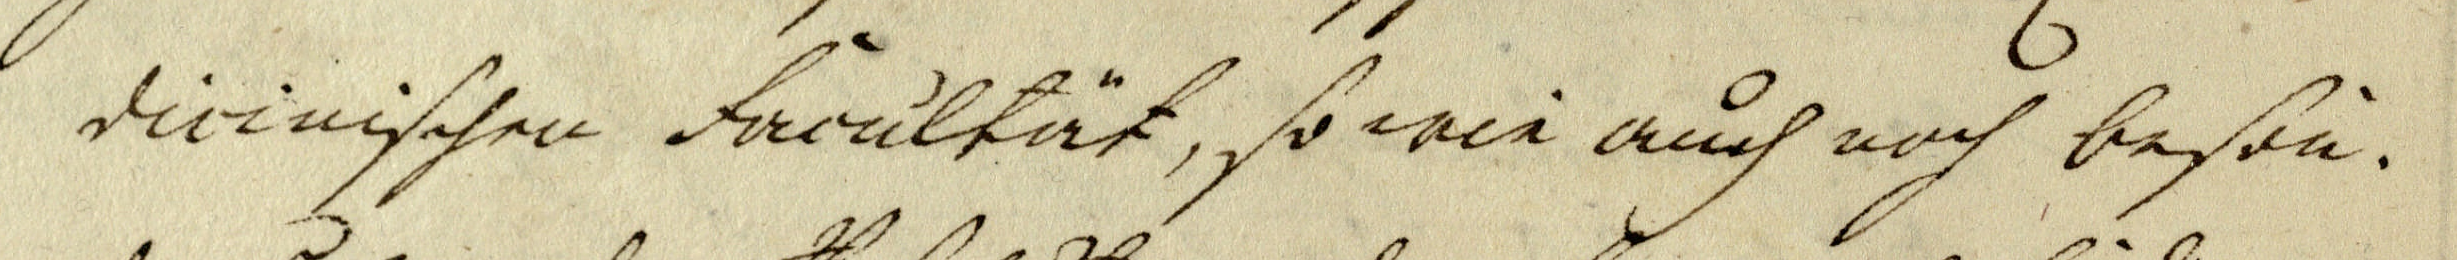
dicinischen Facultät, so wie auch noch beson¬
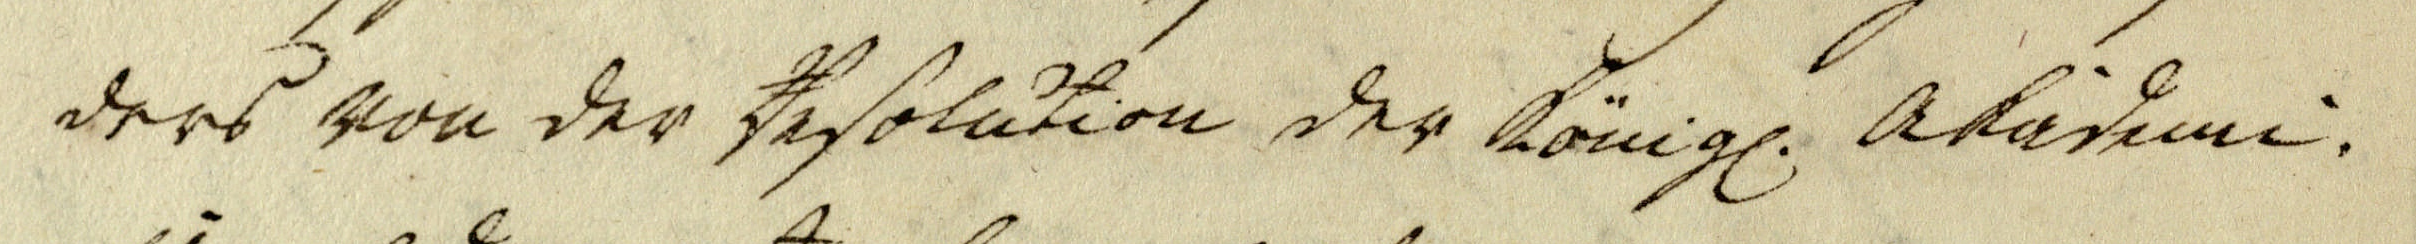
ders von der Resolution der Königl. Akademi¬
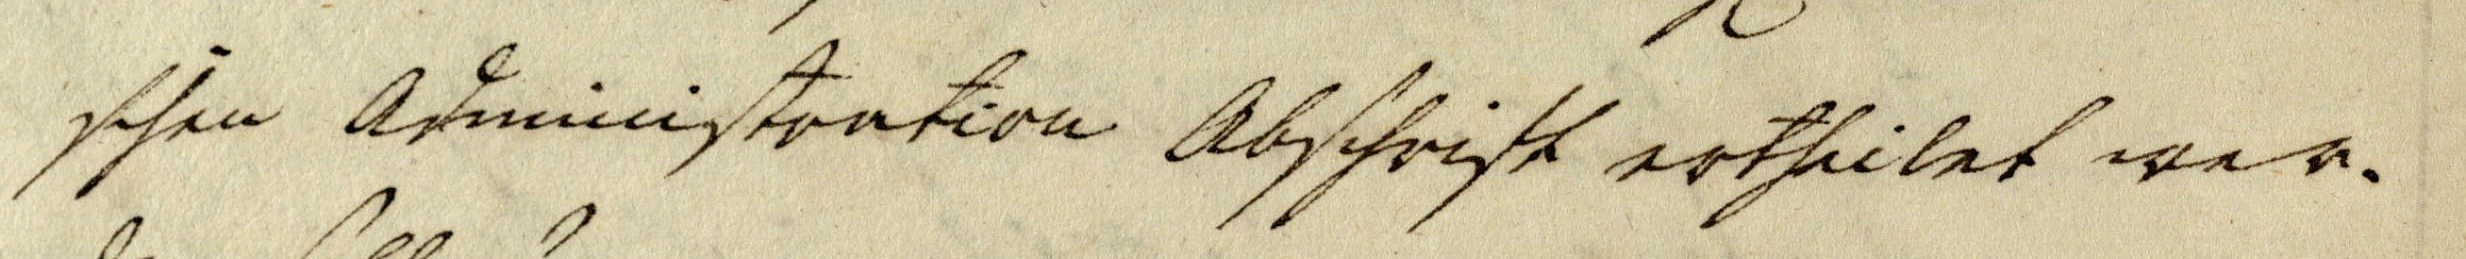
schen Administration Abschrift ertheilet wer¬
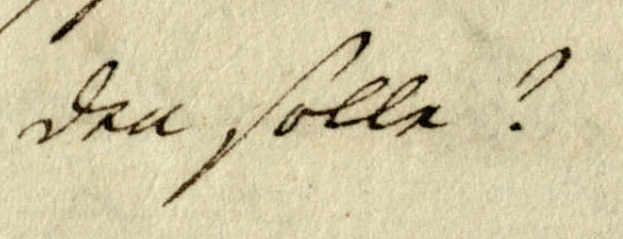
den solle?
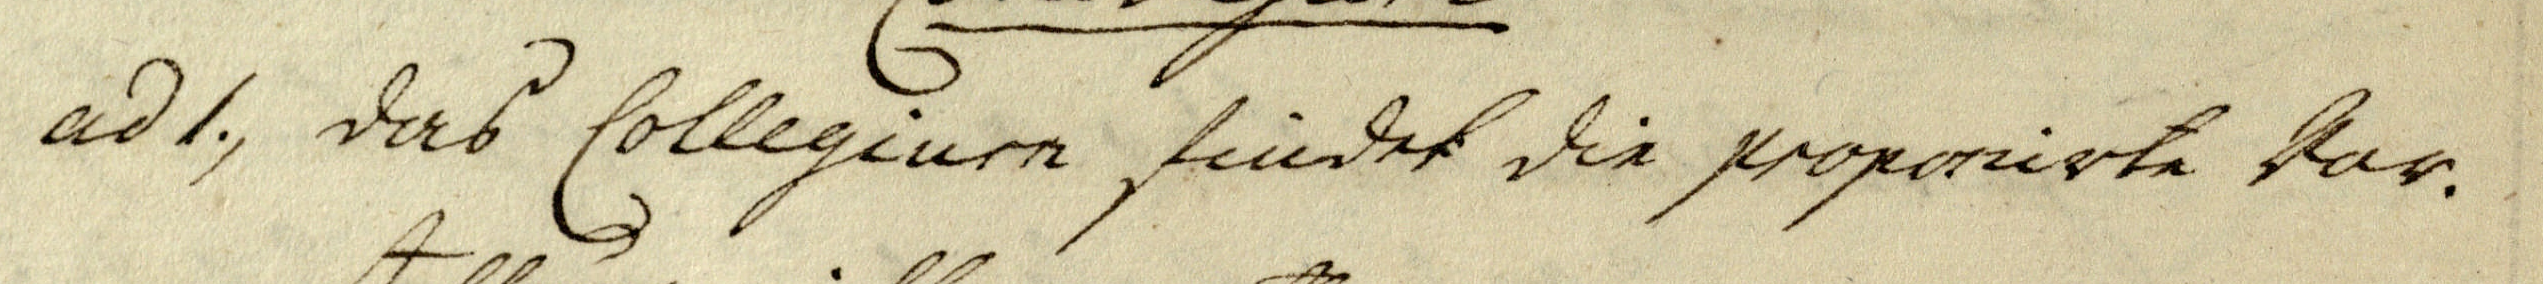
ad 1., das Collegium findet die proponirte Vor¬
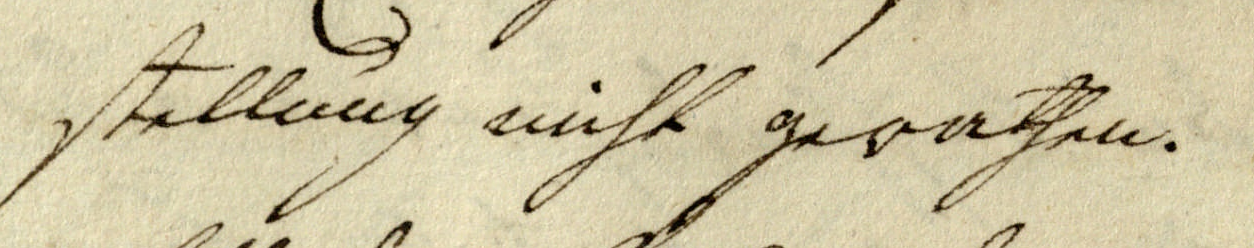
stellung nicht gerathen.
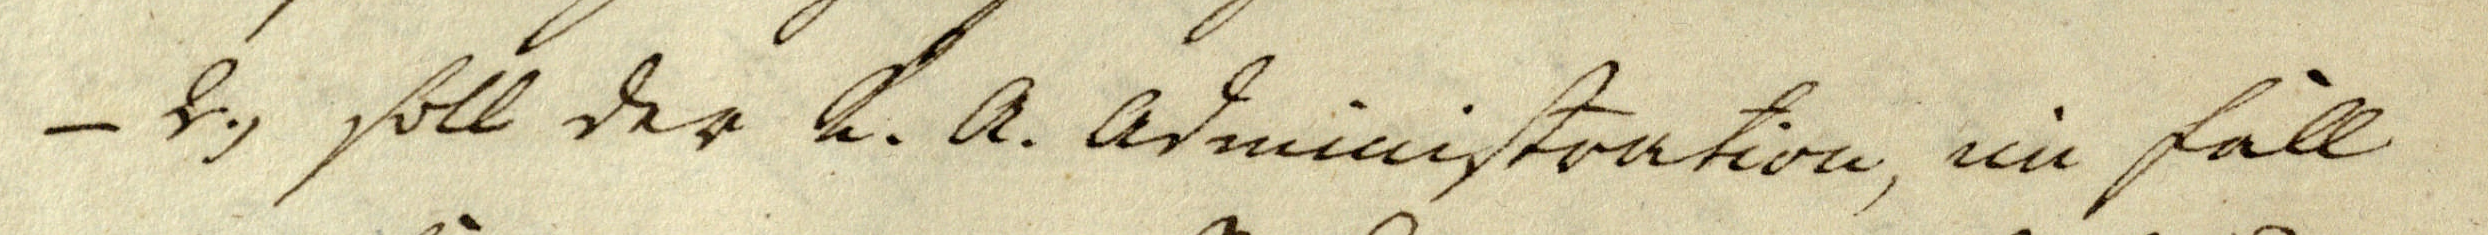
2., soll der K. A. Administration, im Fall
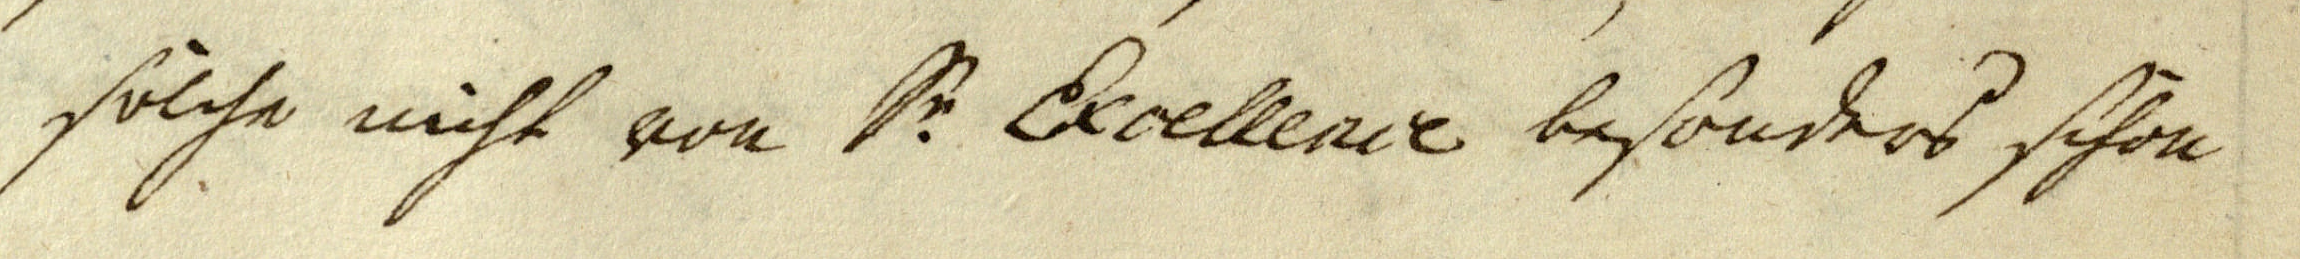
solche nicht von Sr Excellence besonders schon
